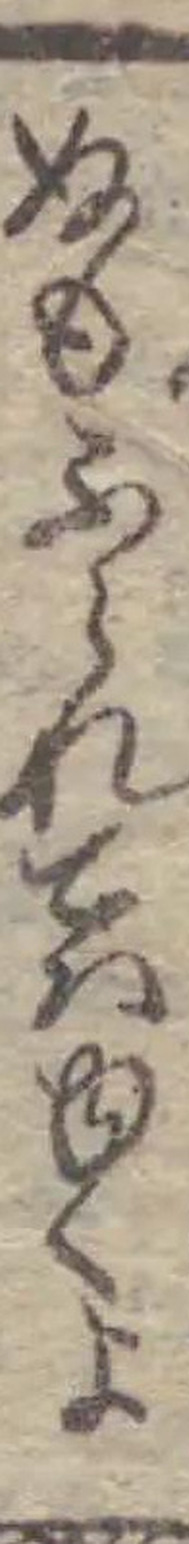ぬもふられてはゆくよ
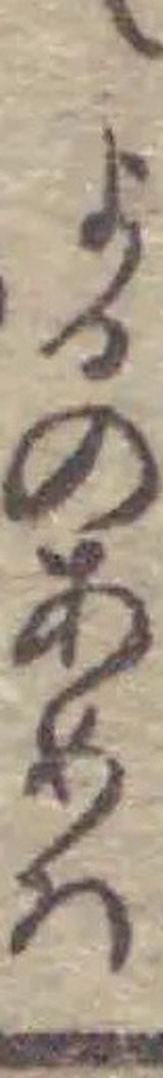よるのあめは
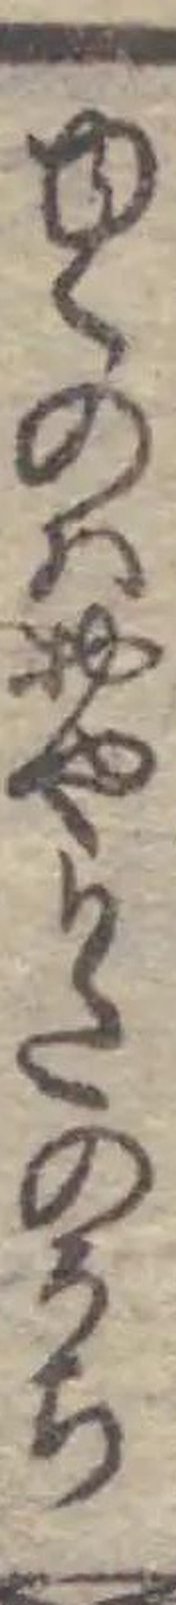ゆくのはおやかたのうち
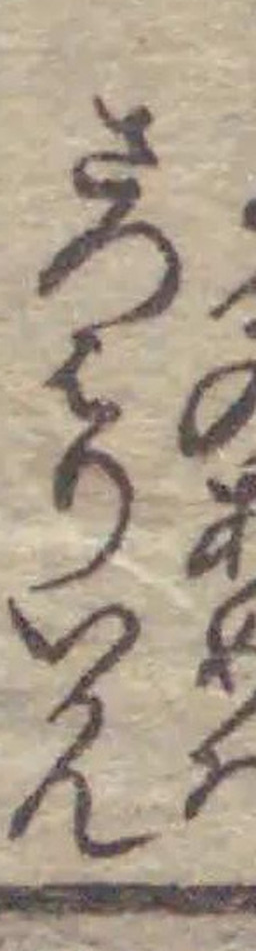さつはりいかん
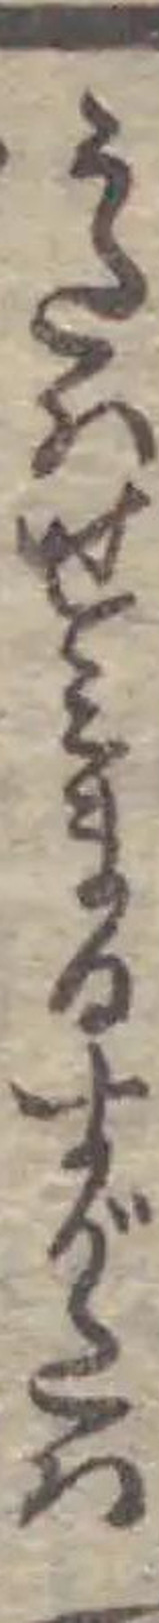かたはせみまるすがたは
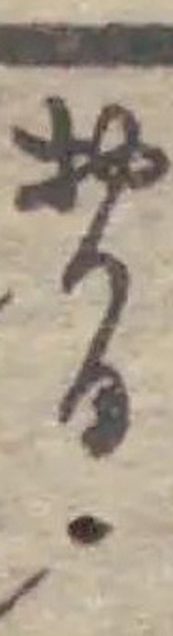おかる
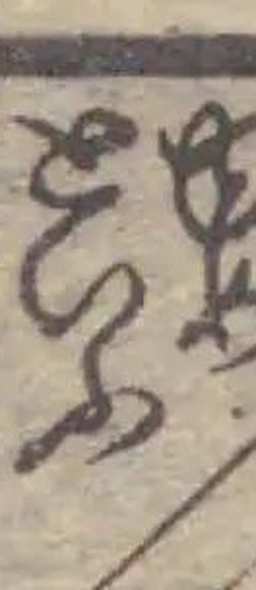といふ
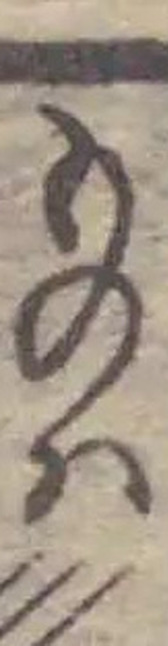ものは
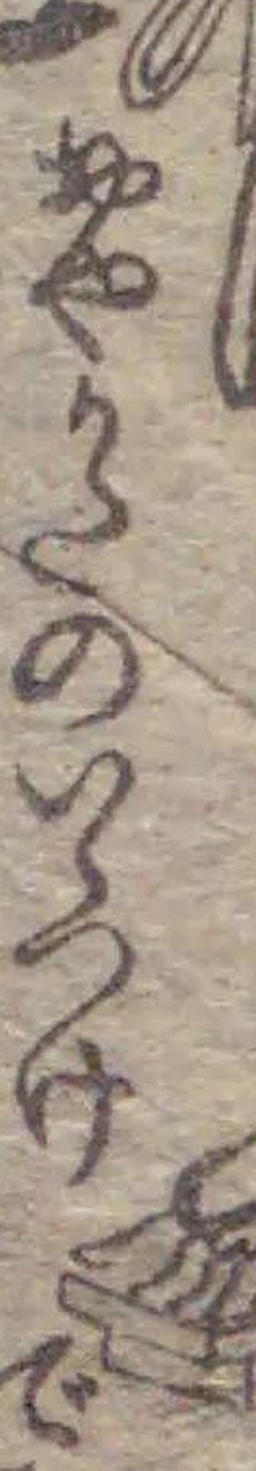おやかたのいゝつけで
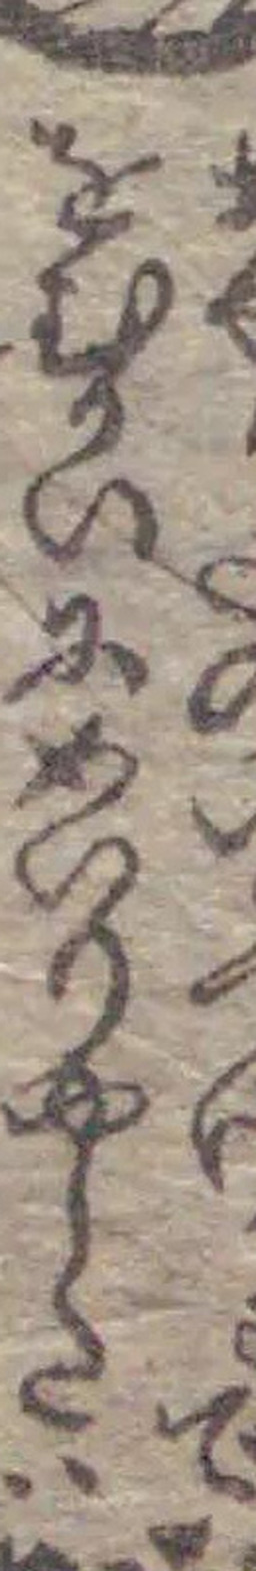をむかいにめいりやした
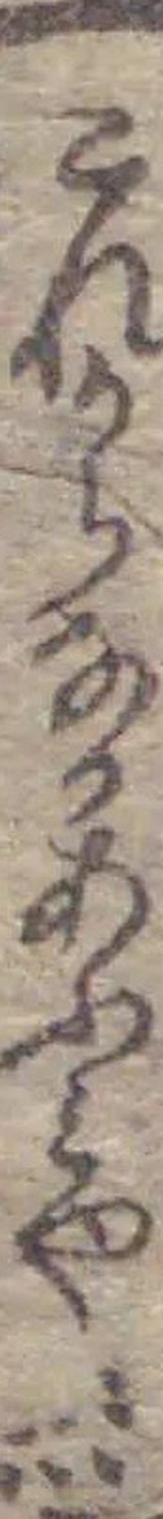これからなかあふみや
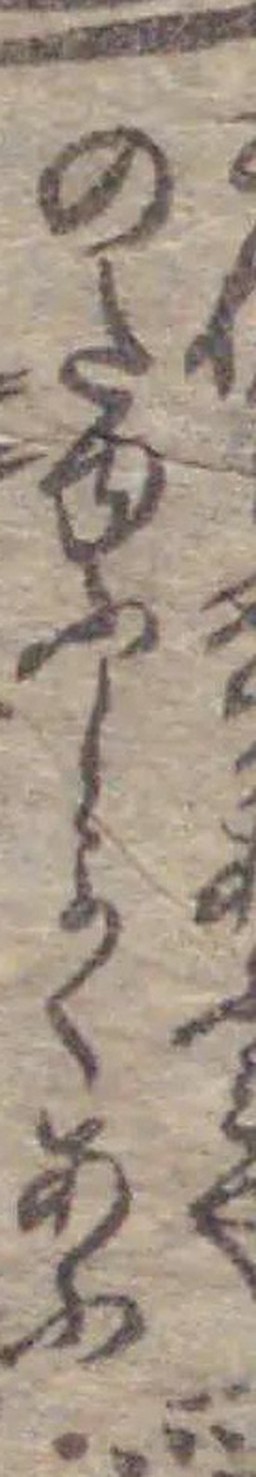のたゆふしよくあふ
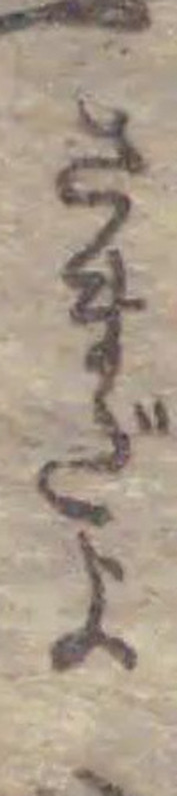さまだよ

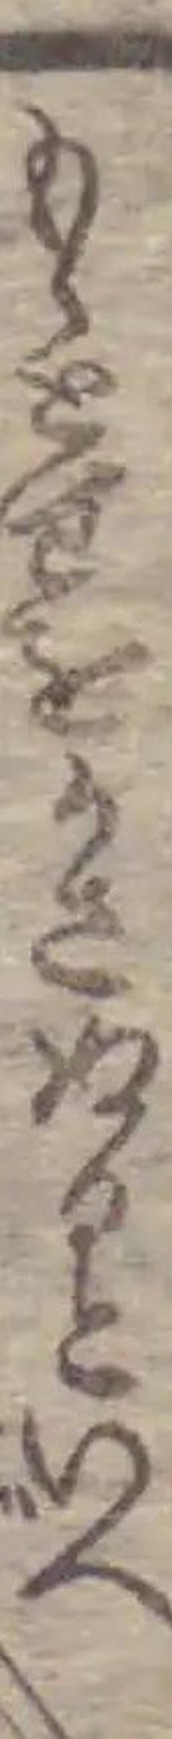もゝとせをかさぬるといへ
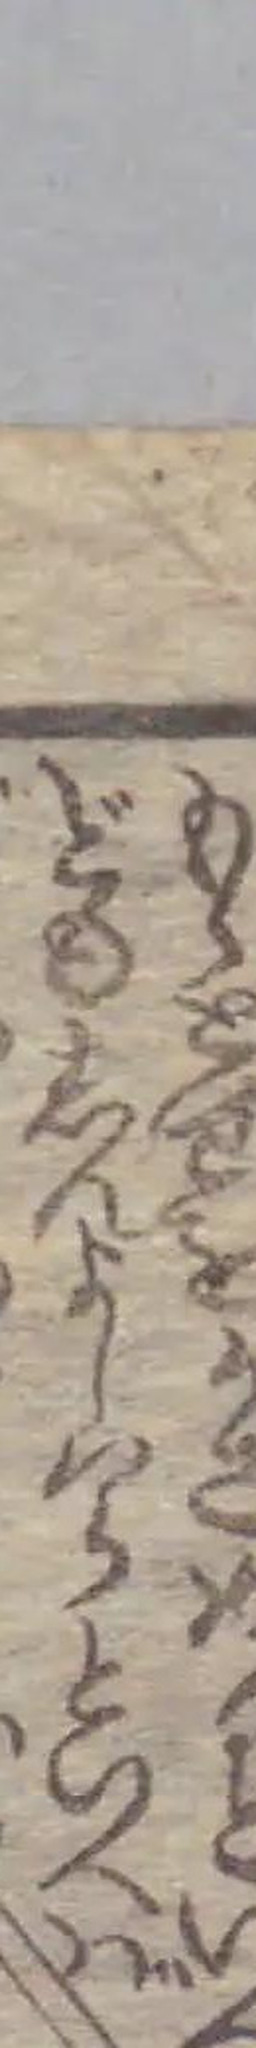どもしんよしはらといへば
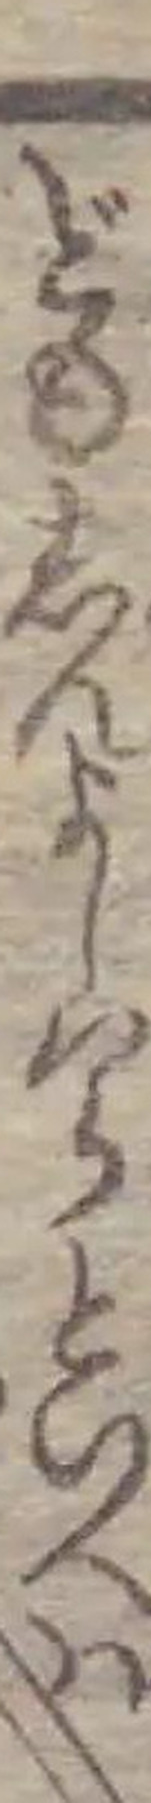どもしんよしはらといへば
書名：かんなんの夢枕 2巻
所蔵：国立国会図書館 National Diet Library, JAPAN
